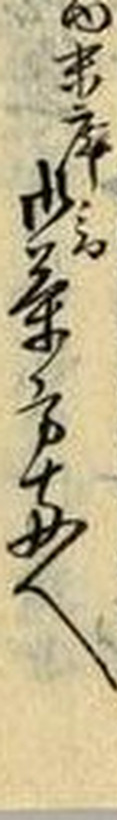御茶方両人
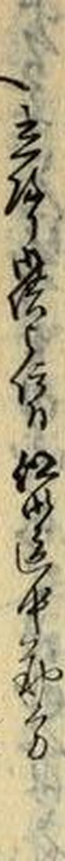立帰り御供被仰付但御道中勤方
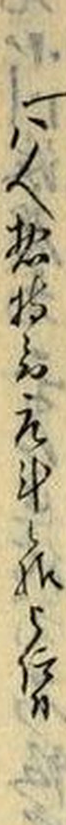八人惣持ニ而取斗候様被仰付
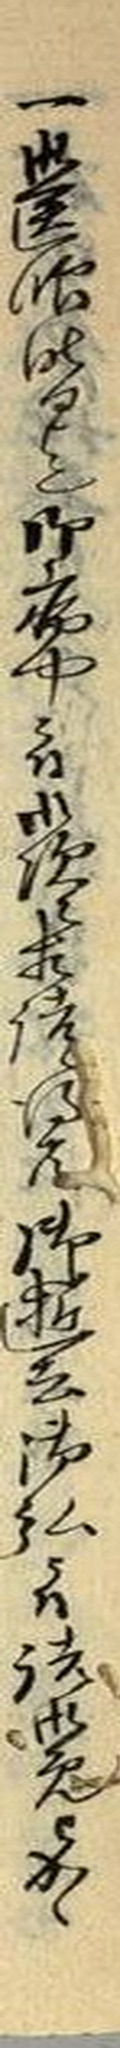一御医師昨日迄御病中ニ付御次ニ相詰候得共御逝去御弘ニ付詰御免被成候
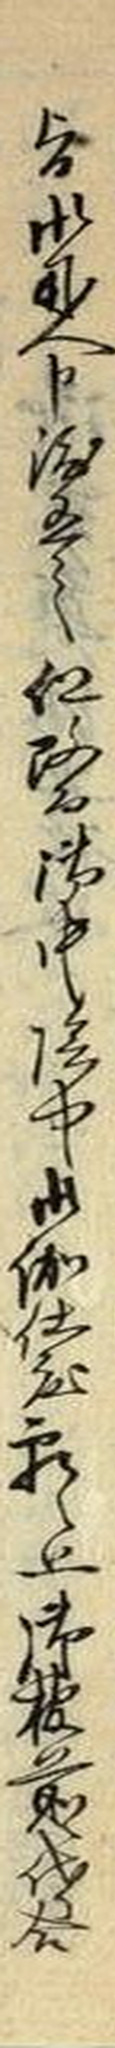旨御用人申渡有之但改而御中陰中御伽仕度願之上御棺前へ代り合
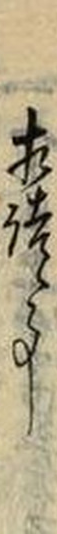相詰候事
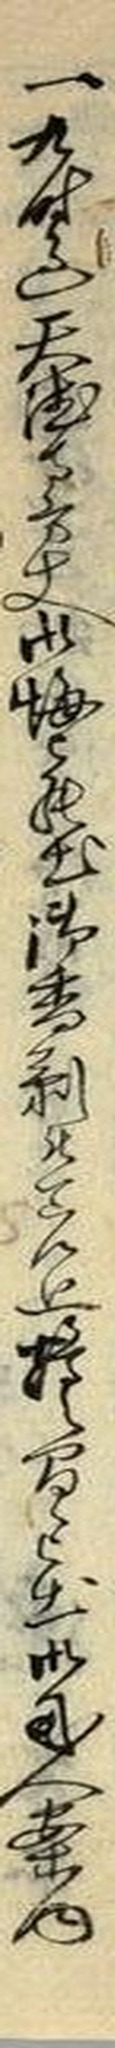一九時過天徳寺方丈御悔被罷出御香剃被差上鶴之間へ被出御用人案内
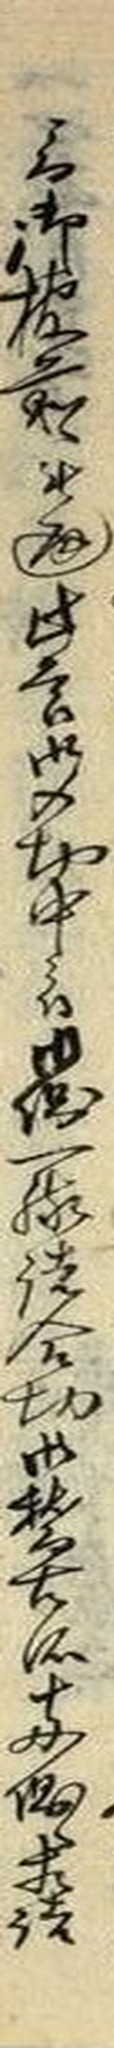ニ而御棺前へ被通此節御〆切中ニ付御側一統詰合切御稽古所両側へ相詰
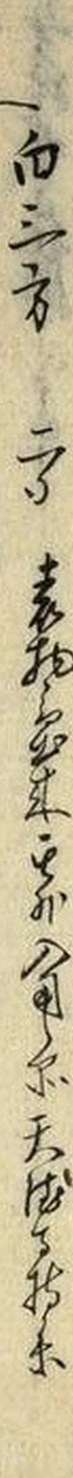白三方二ツ表物ニ而出来其外入用之品天徳寺持参
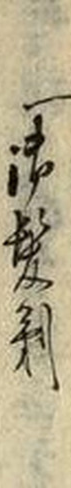御髪剃
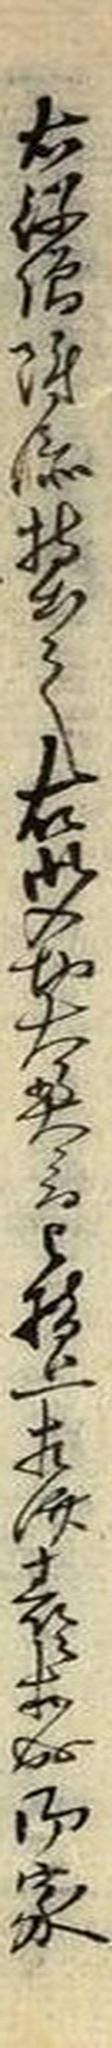右役僧附添持出之右御〆切大奥ニ而被指上相済表ニ相成御家
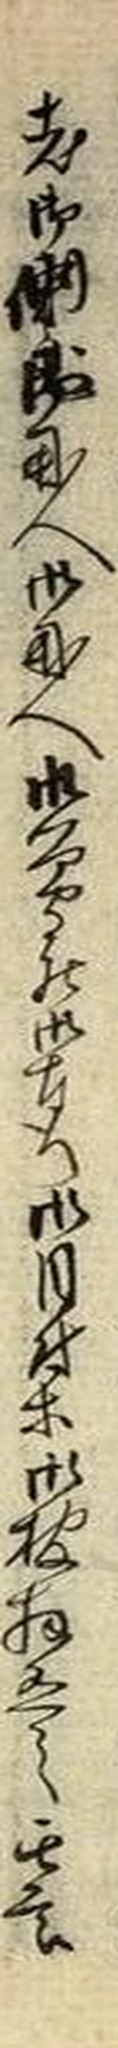老御側御用人御用人御留守居御奉行御目付等御棺拝有之其節
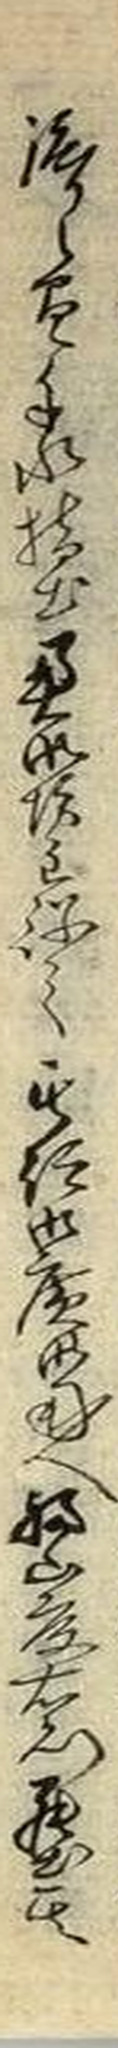渡り之間へ手水指出奥御坊主役之其跡御広御用人福山藤右衛門罷出其
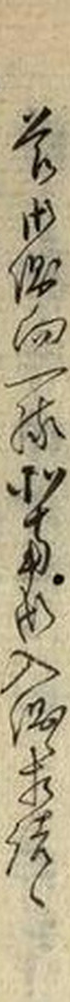節御側向一統北南御入側へ相詰候
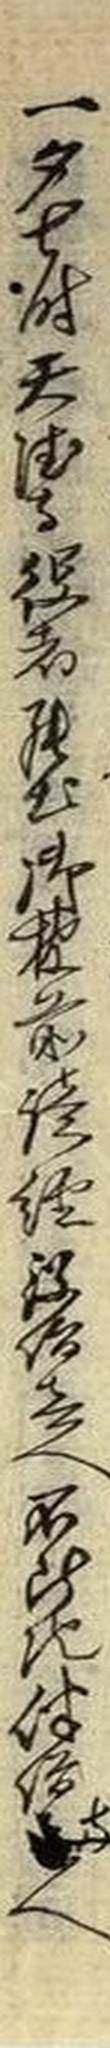一夕七時天徳寺役者罷出御棺前読経役僧壱人不断院伴僧両人
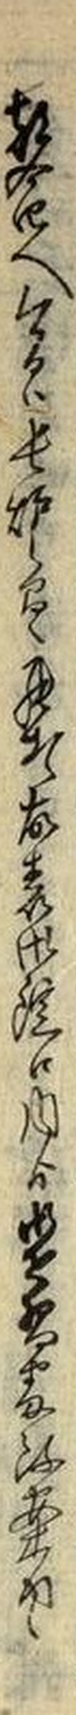都合四人今日ハ長炉之間へ罷出候故表御錠口内ゟ御近習番致案内候
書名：少傅日録抄（斉承付側向頭取日記、在府）
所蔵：福井県文書館 Fukui Prefectural Archives
